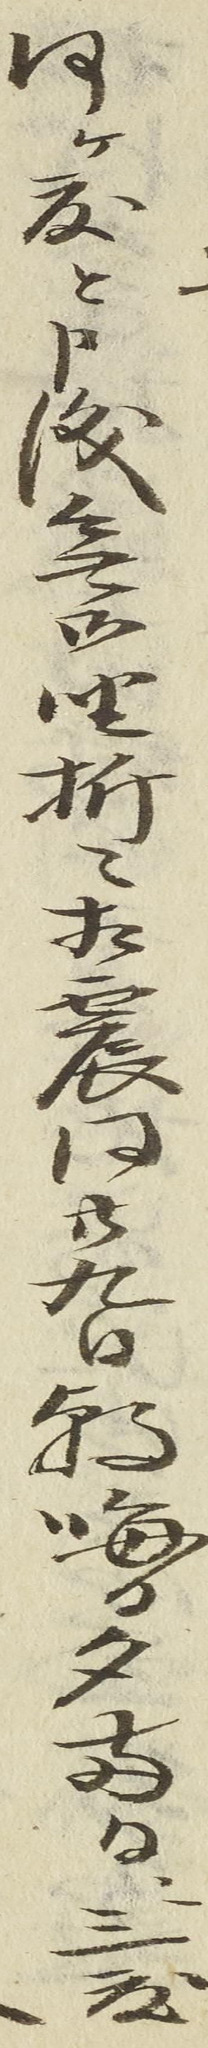何ヶ度と申儀無御座折々相震同廿九日朝晦日夕両日ニ三度
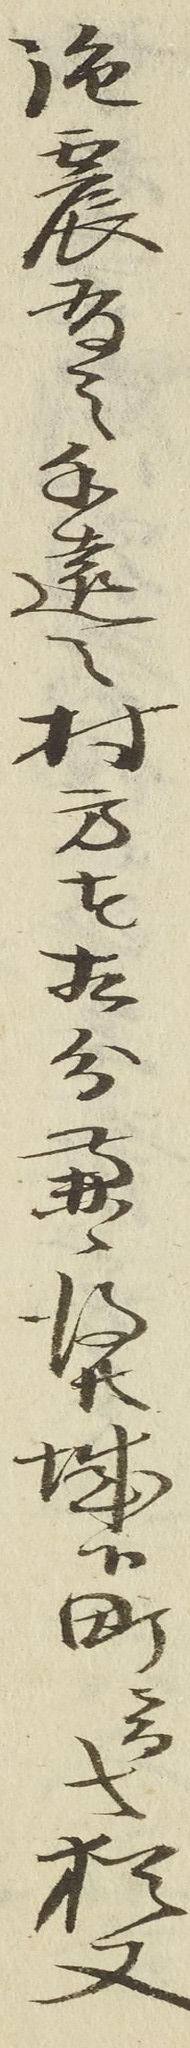強震有之手遠之村方は相分兼候得共城下町二而は猶又
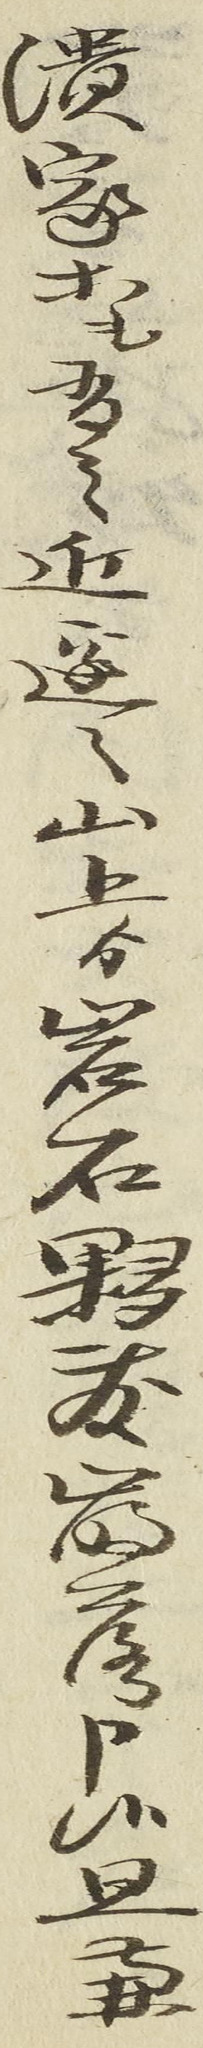潰家等も有之近辺之山上より岩石夥敷崩落申候且兼
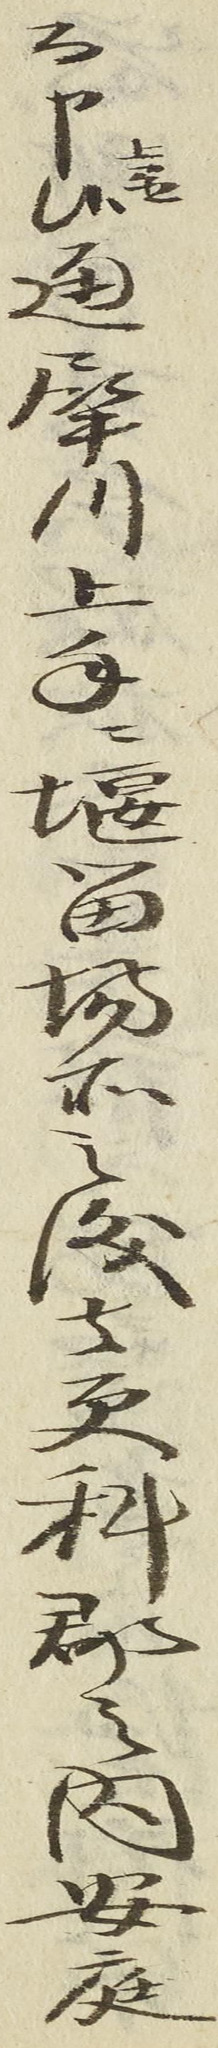而申上置候通犀川上手二堤留場所之儀は更級郡之内安庭
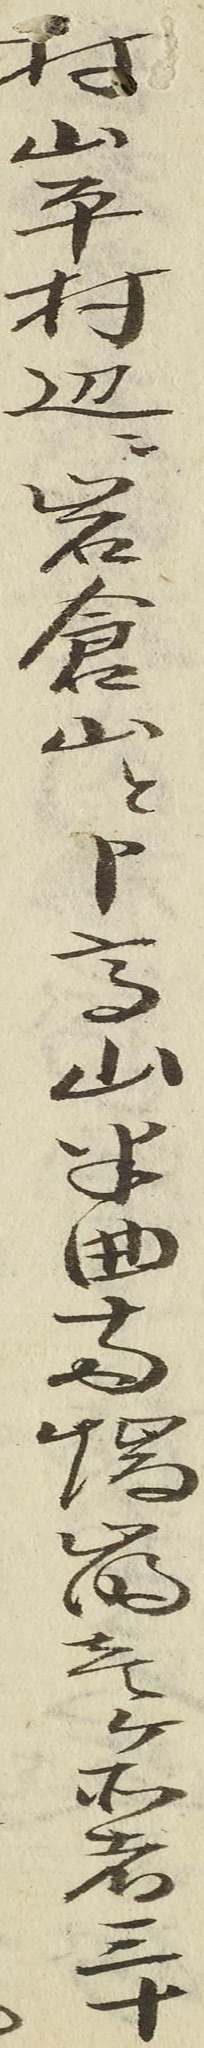村山平村之辺ニ岩倉と申高山半曲両端崩壱ヶ所ハは三十
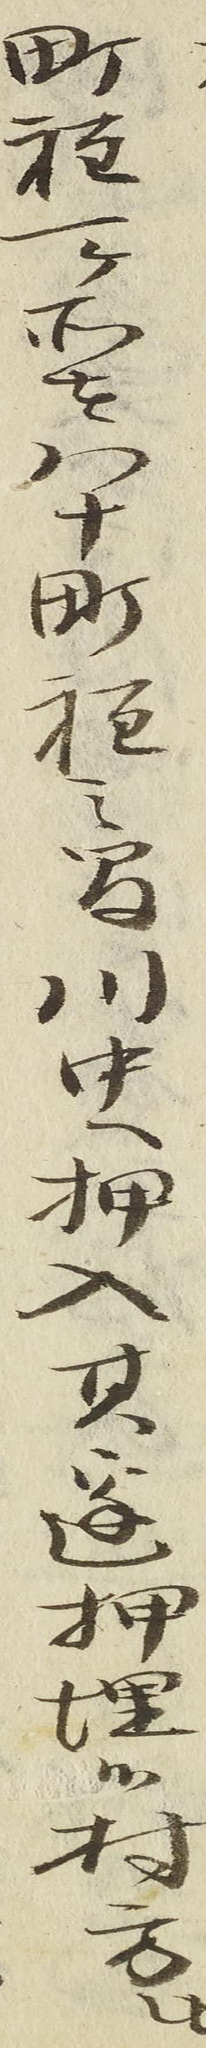町程一ヶ所は八十町程之間川中へ押入其辺押埋候村方も
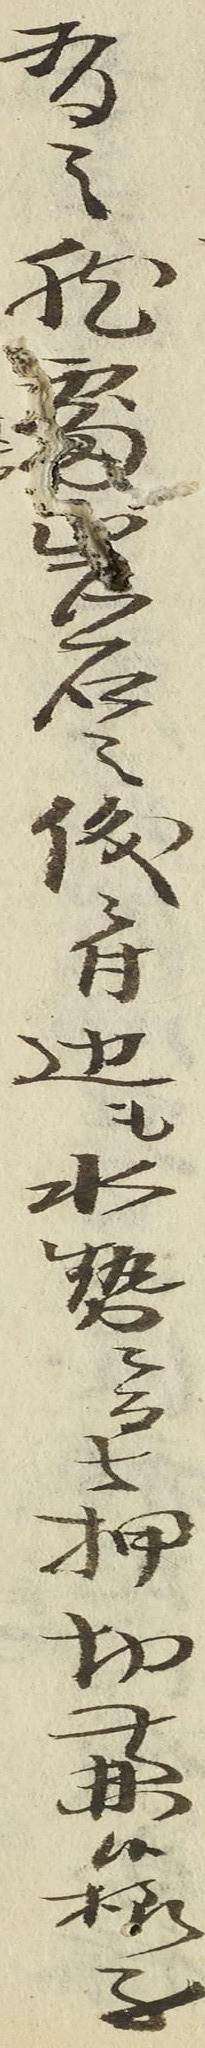有之然所多岩石之儀二付迚も水勢二而は押切兼候様子
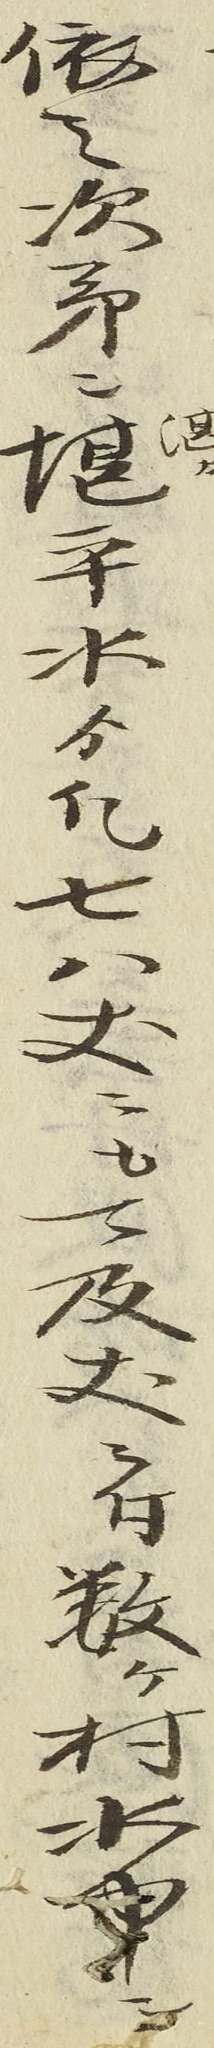依之次第二湛平水ゟ凡七八丈二も可及丈二付数ヶ村水中二
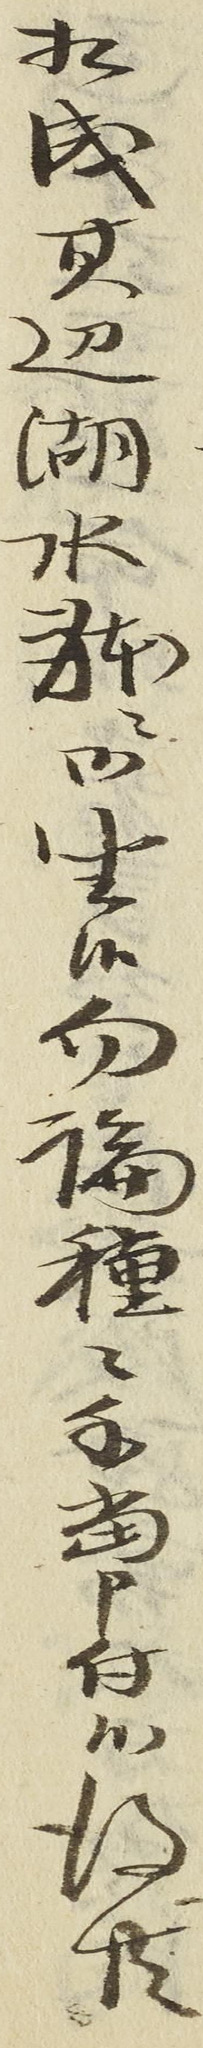相成其辺湖水躰二御坐候勿論種々手当申付候得共
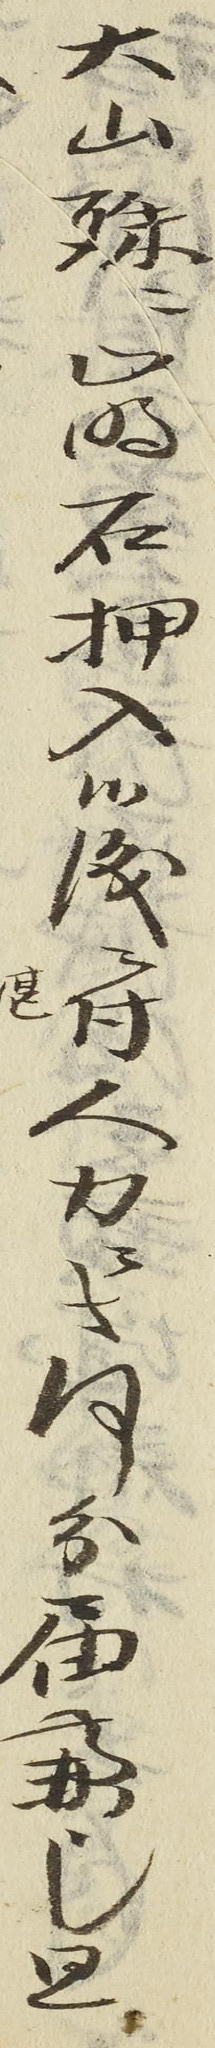大山殊二崩石押入候儀二付人力二は何分届兼申候且
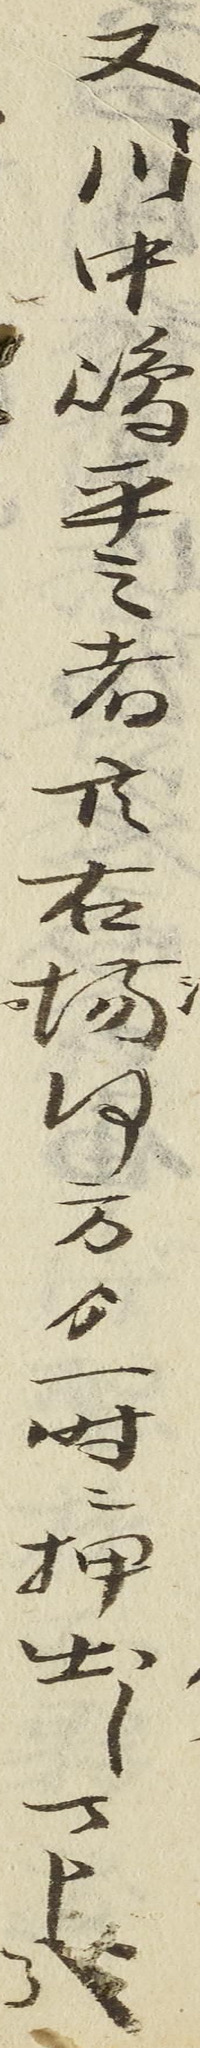又川中嶋平之者共右場何方ゟ一時二押出ㇱ可申哉
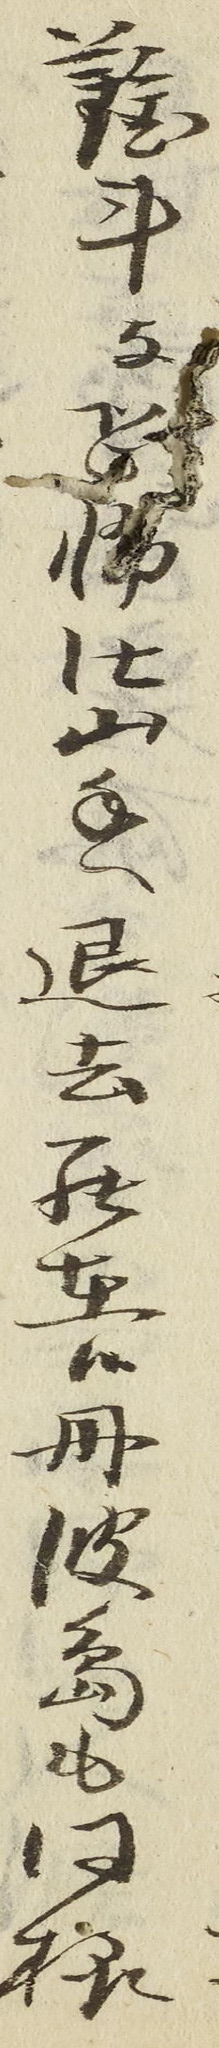難計と恐怖仕山手へ立退罷在候丹波嶋も同様
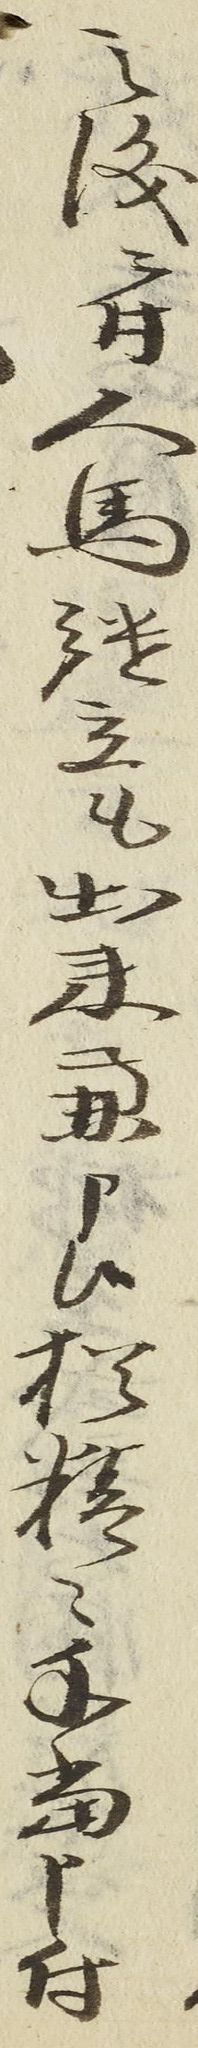之儀二付人馬継立も出来兼申候猶精々手当申付
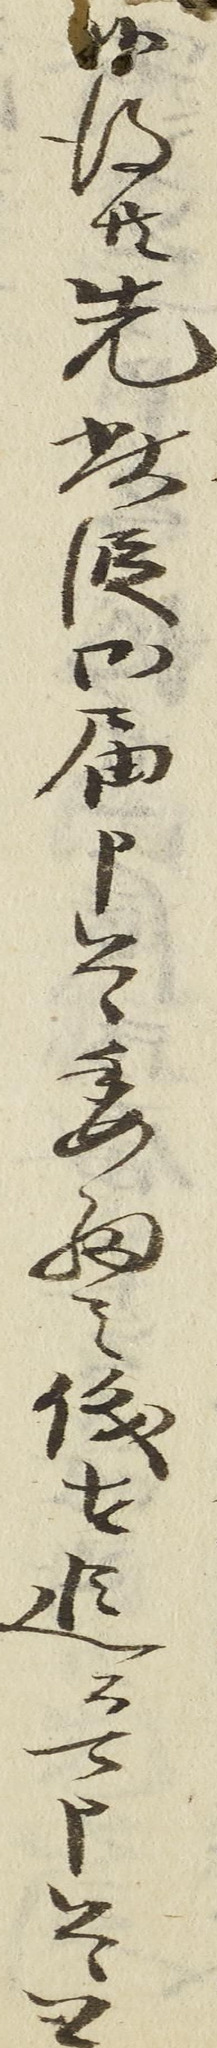候得共先此段御届申上候委細之儀は追而可申上候以上
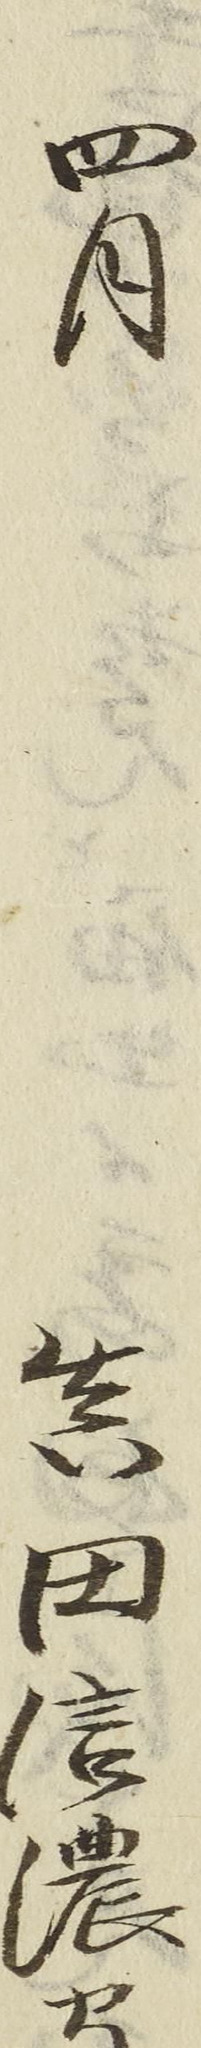四月真田信濃守
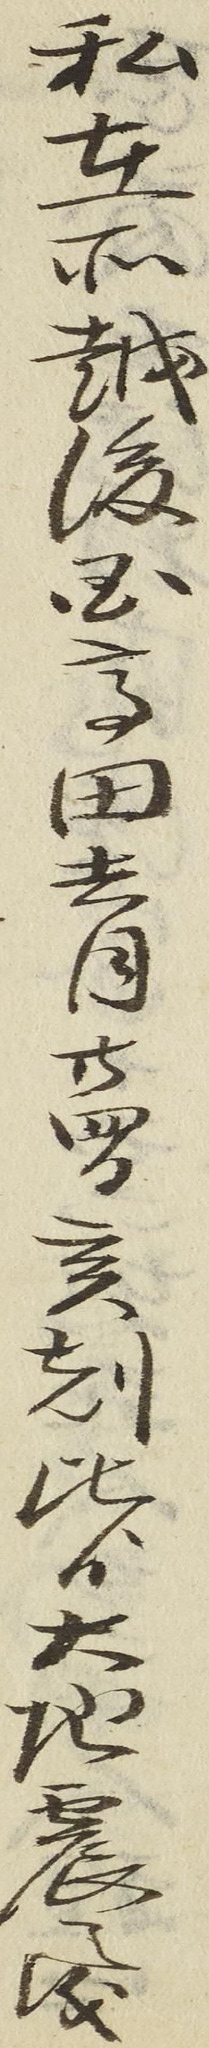私在所越後国高田去月廿四日亥刻比ゟ大地震之儀
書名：信濃國大地震記　乾
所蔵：東京大学地震研究所図書室 Earthquake Research Institute Library, The University of Tokyo, JAPAN
